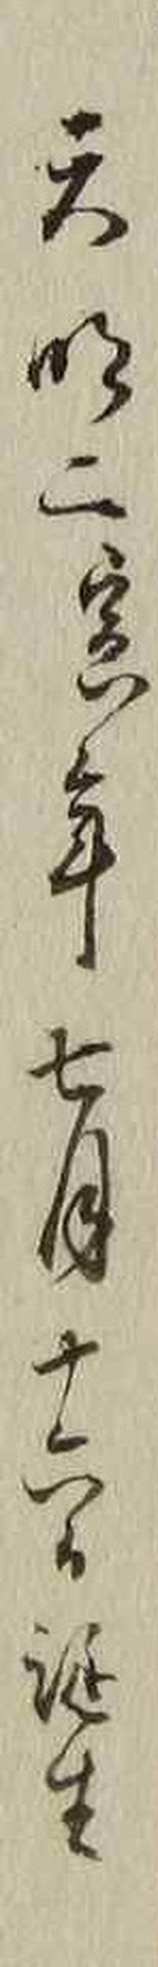天明二寅年七月十六日誕生
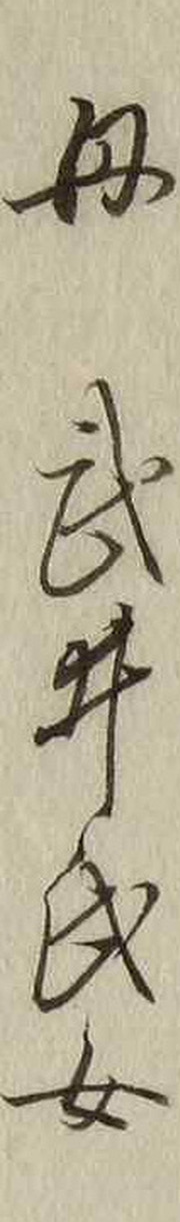母武井氏女
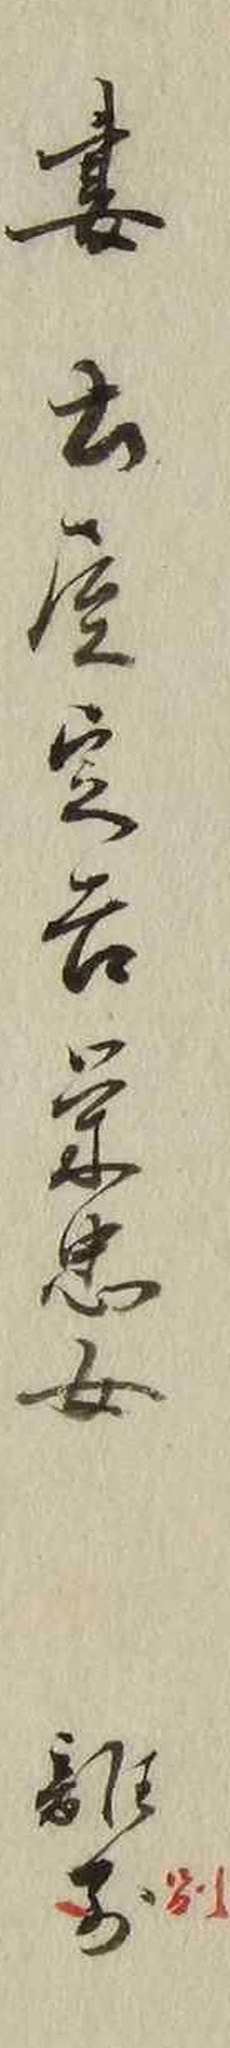妻土屋定吉栄忠女離別
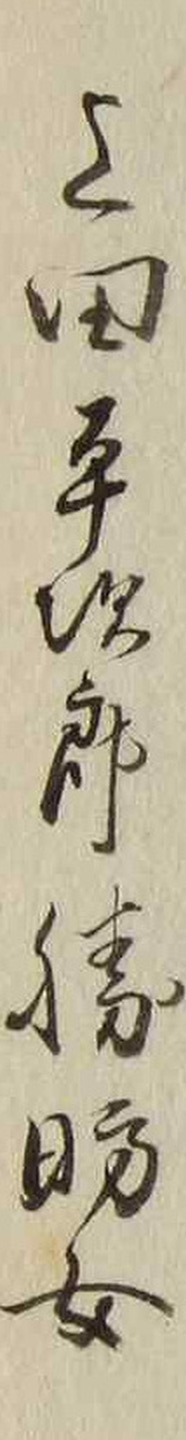上田平次郎勝昉女

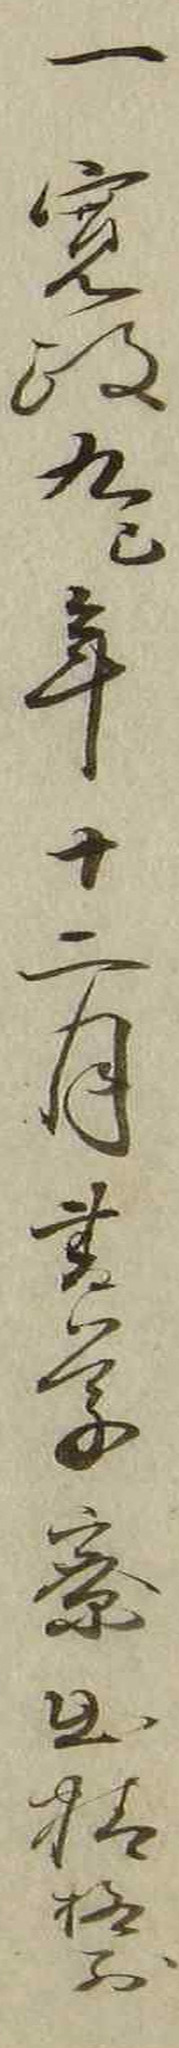一寛政九巳年十二月書学寮出精格別
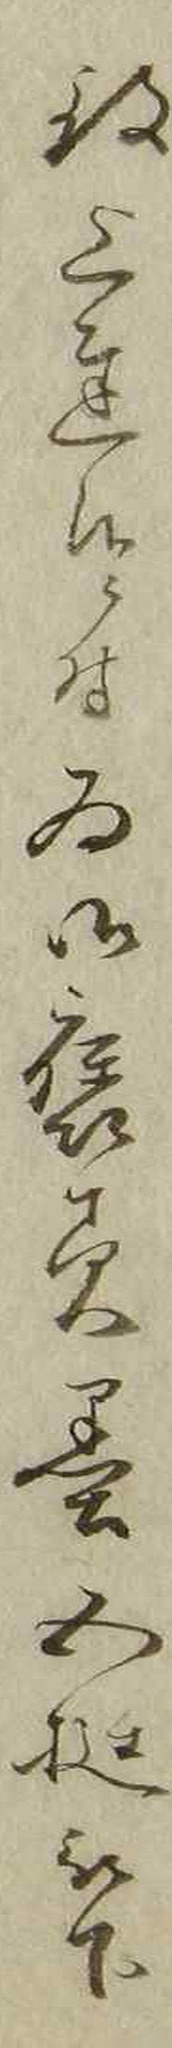致上達候ニ付為御褒美墨五挺被下
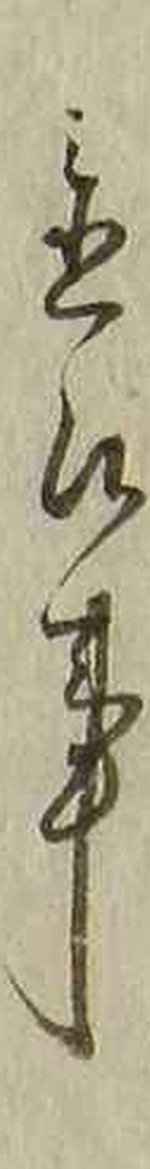置候事
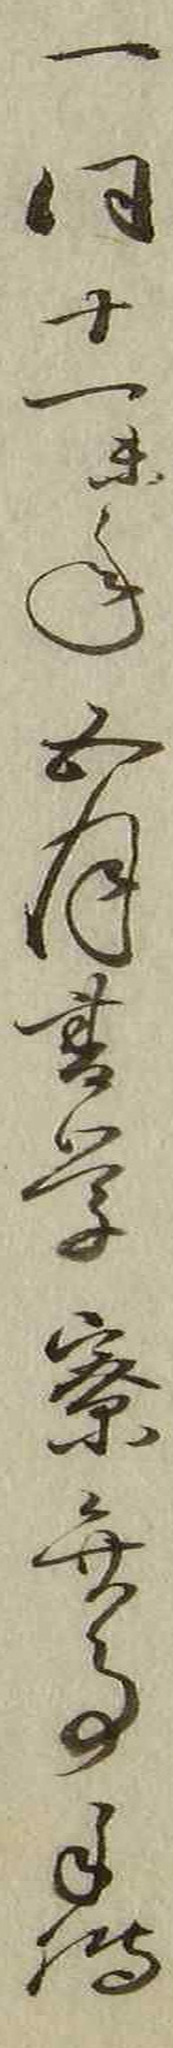一同十一未年五月書学寮弁事手伝
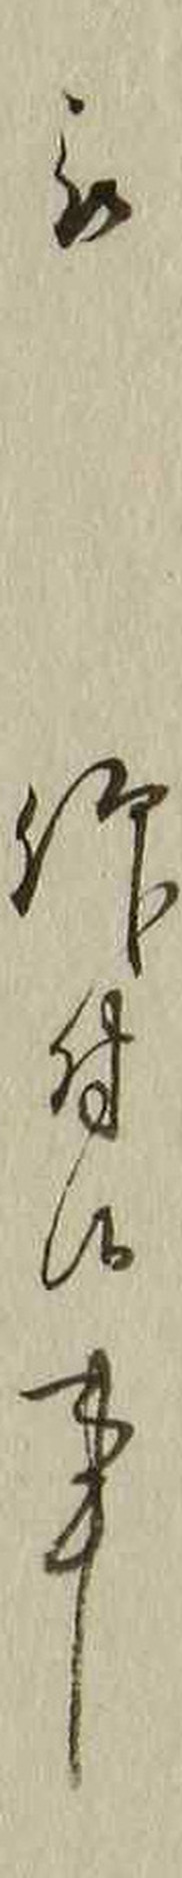被仰付候事
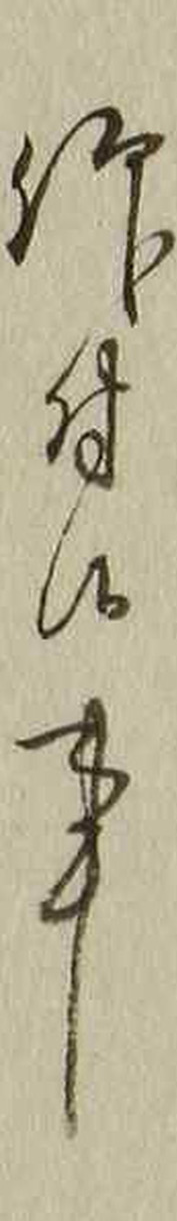仰付候事
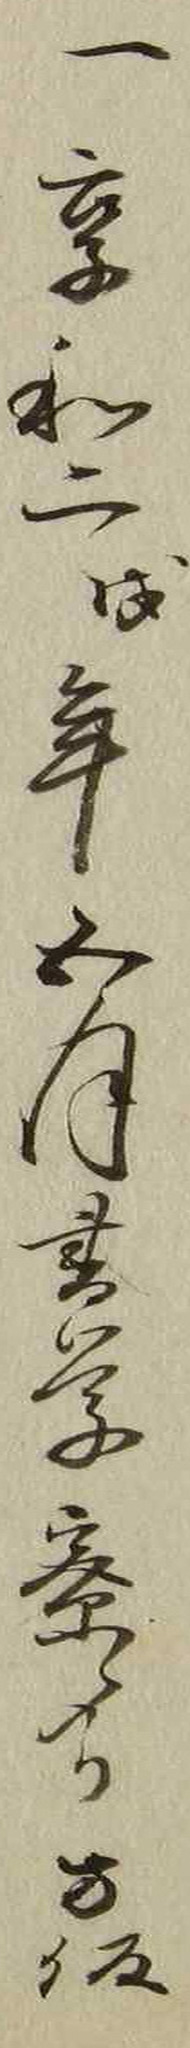一享和二戌年五月書学寮〆り方仮
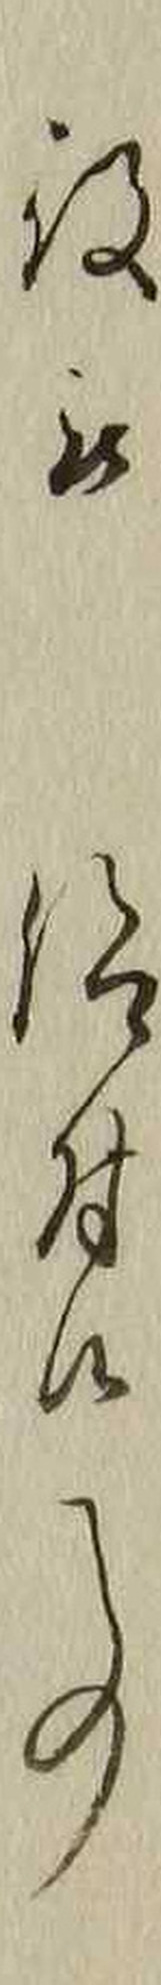役被仰付候事
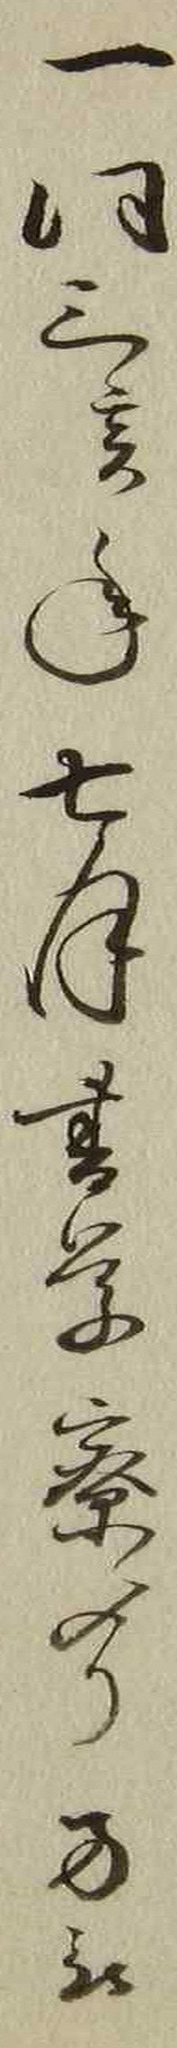一同三亥年七月書学寮〆り方被
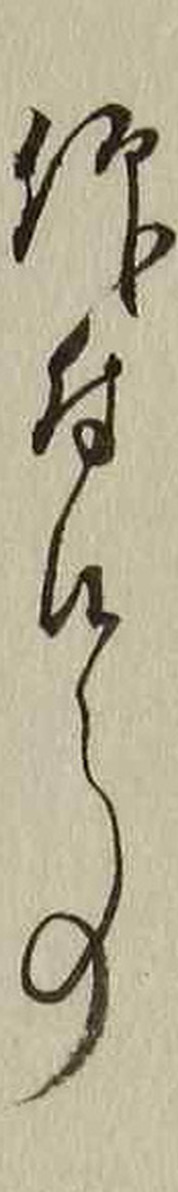仰付候事
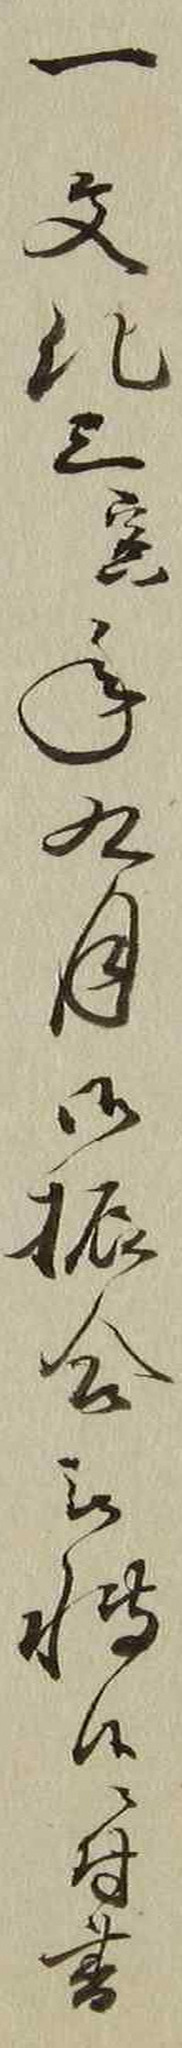一文化三寅年九月御振合被転候ニ付書
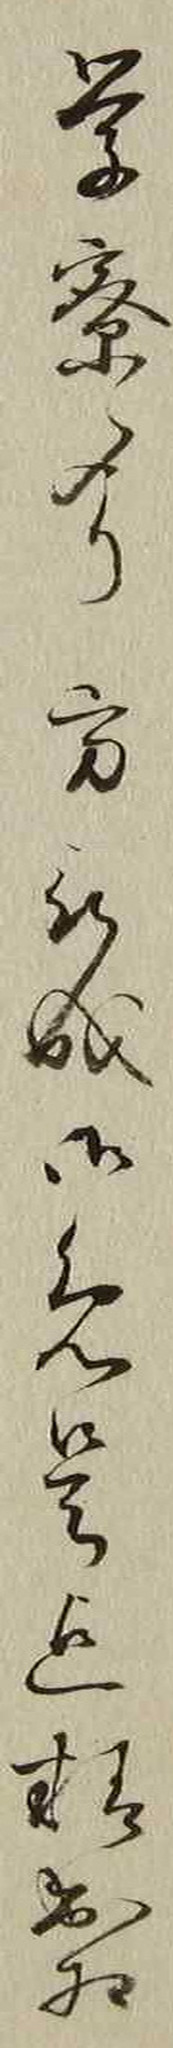学寮〆り方被成御免是迄精出相
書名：諸士系譜　巻之4　い之部4
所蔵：会津若松市立会津図書館
